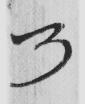乃
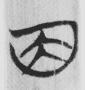因
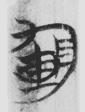軍
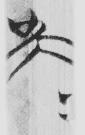吳=
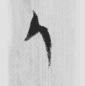人
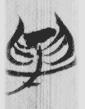昆
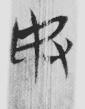奴
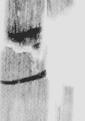乃
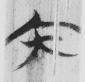內
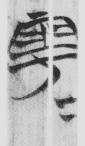雨于=
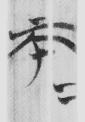帀=
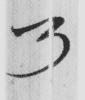乃
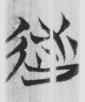述
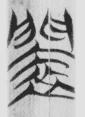{門衣衣}
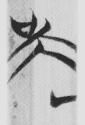吳
